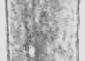五
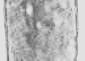十
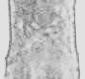九
